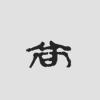尙
